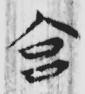宮
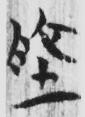○（地）
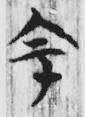○（主）
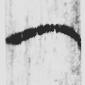一
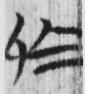於
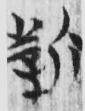新
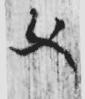父
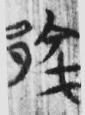○（蔡）
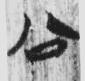公
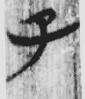子
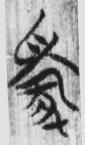○（家）
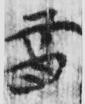酉（酒）
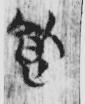○（食）
